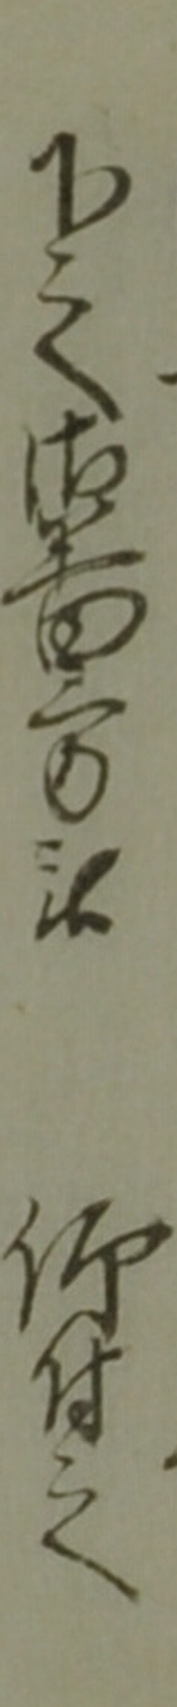下之御番方被仰付之
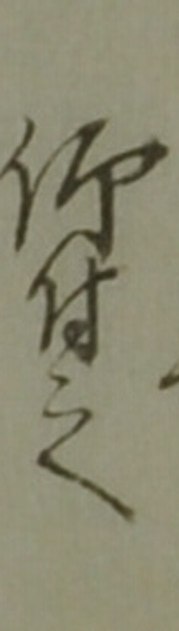仰付之
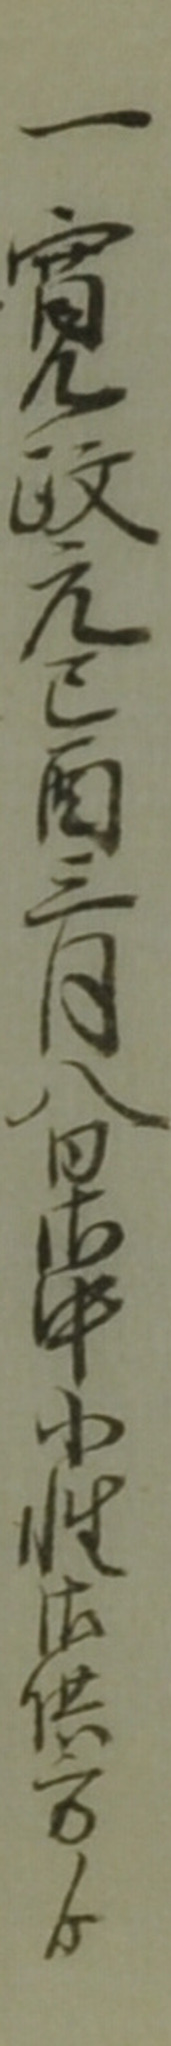一寛政元己酉三月八日御中小姓御供方より
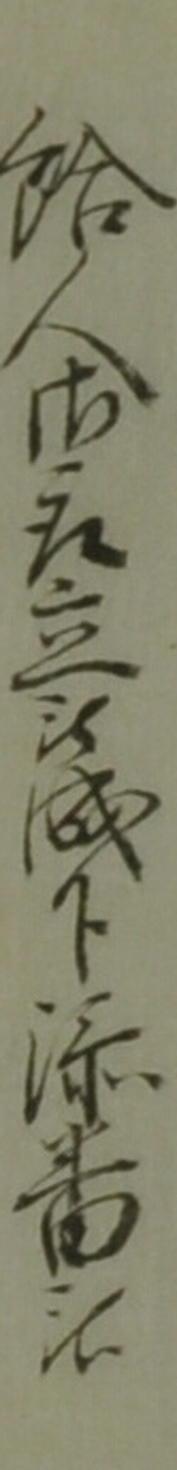給人御取立被成下添番被
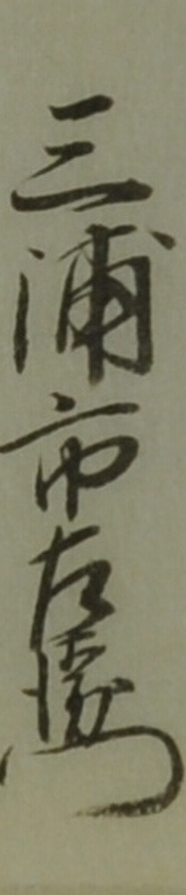三浦市左衛門
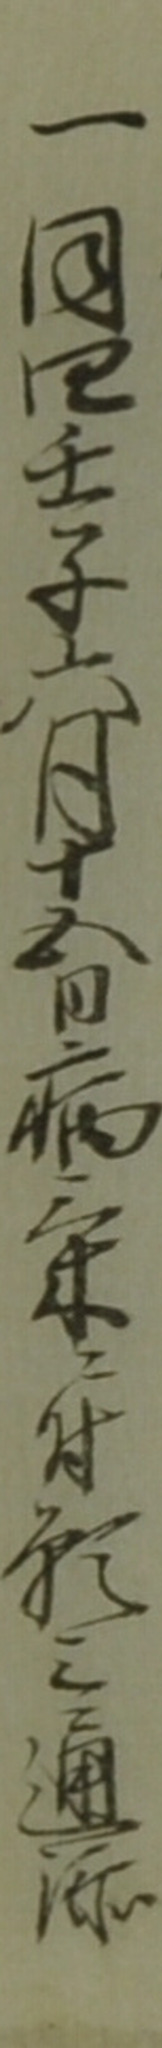一同年壬子六月十五日病気ニ付願之通添
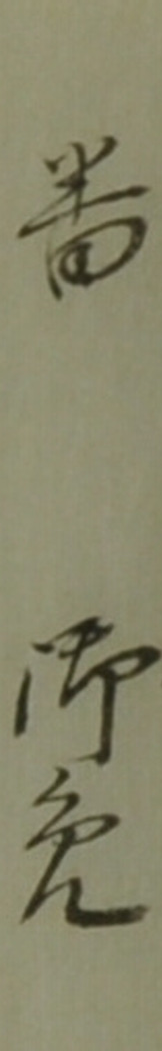番御免
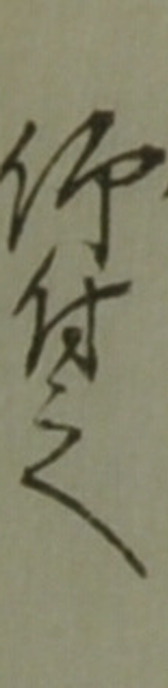仰付之
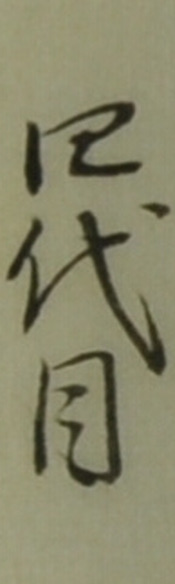四代目

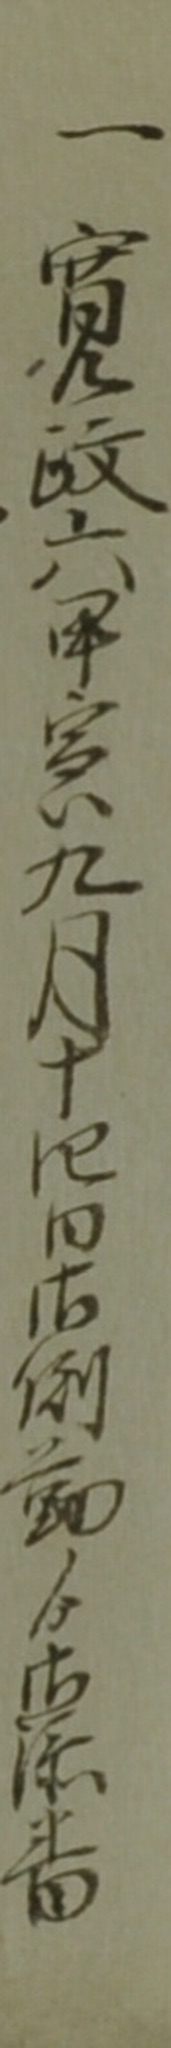一寛政六年甲寅九月十四日御例勤より御添番
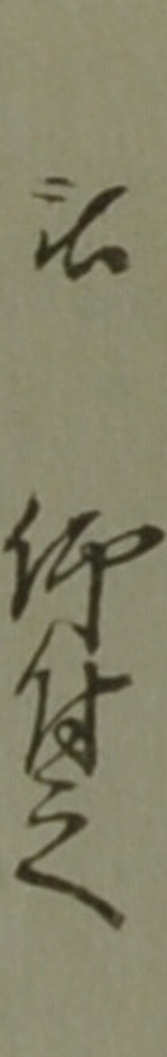被仰付之
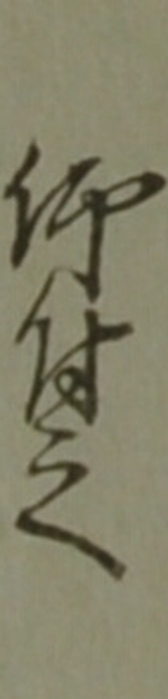仰付之
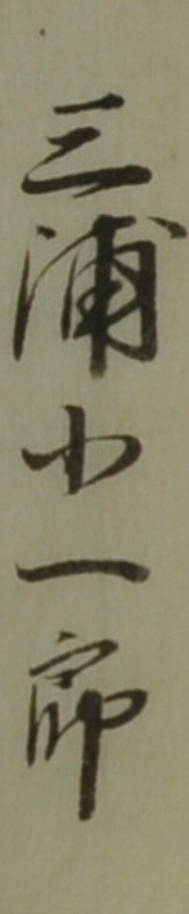三浦小一郎
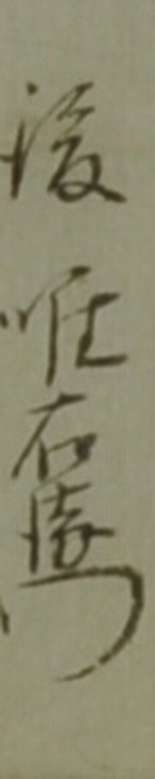後唯右衛門
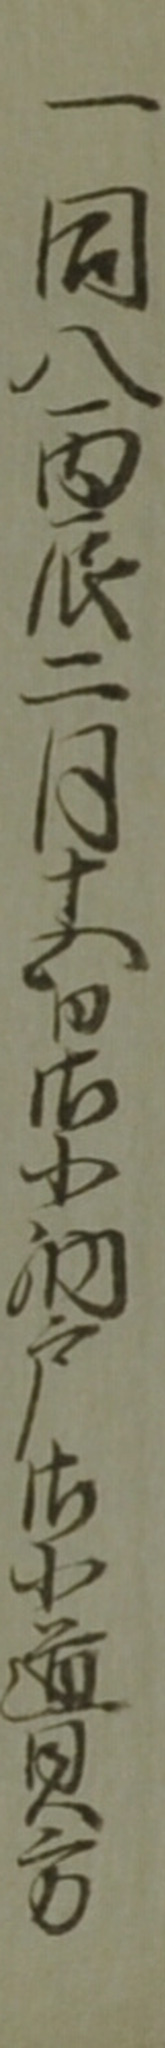一同八丙辰二月十五日御小納戸御小道具方
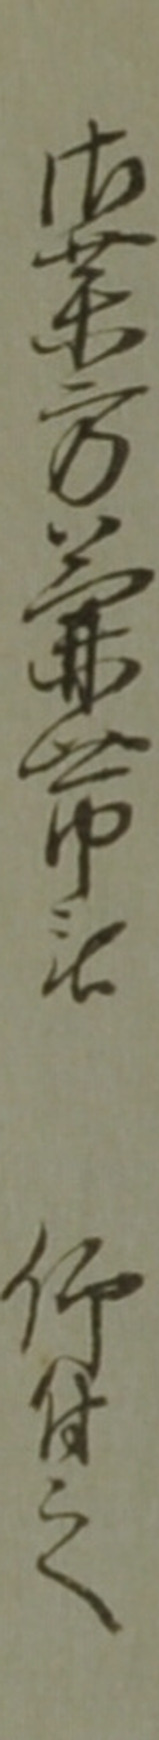御茶方兼帯被仰付之
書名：諸御役代々録（八）
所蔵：伊那市立高遠町図書館・合同会社AMANE
